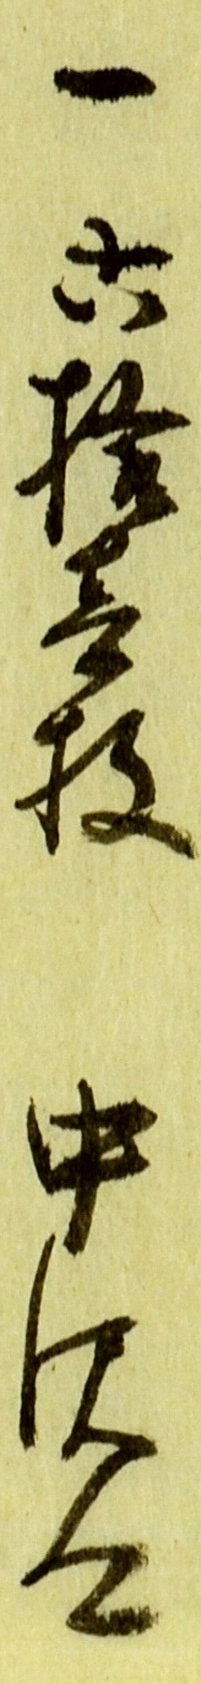一六拾壱枚中沢郷
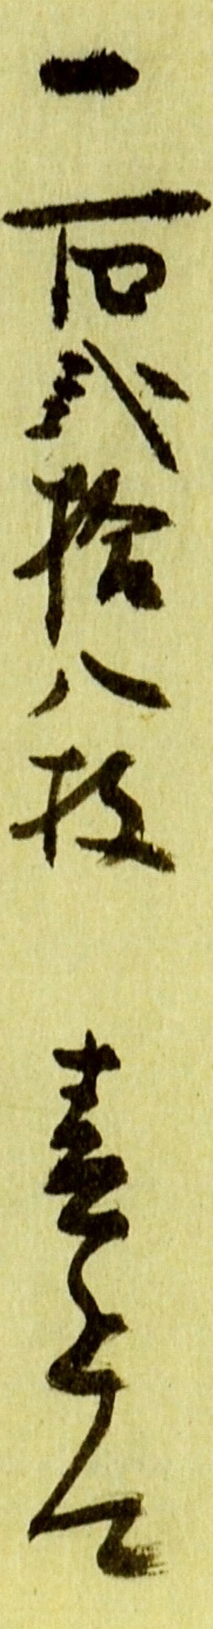一百弐拾八枚春近郷
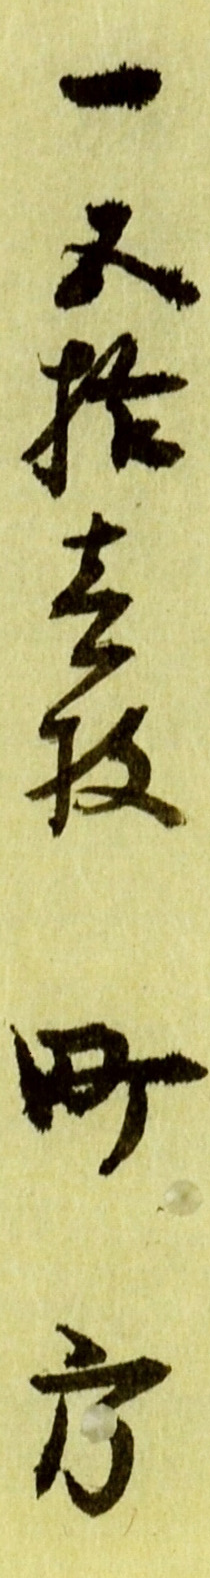一五拾壱枚町方
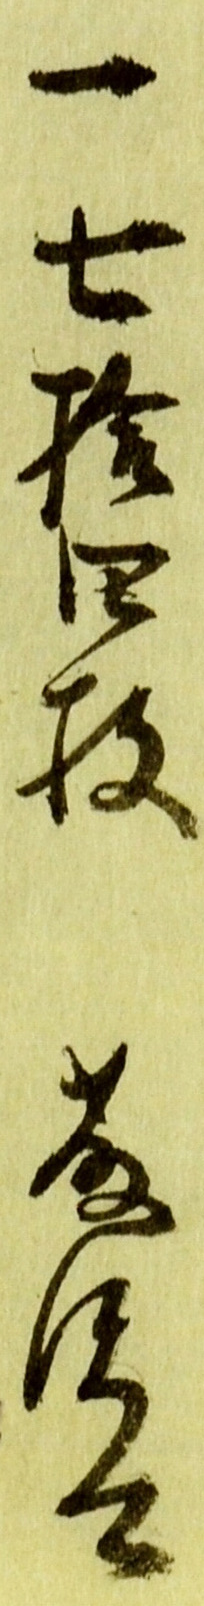一七拾四枚藤沢郷
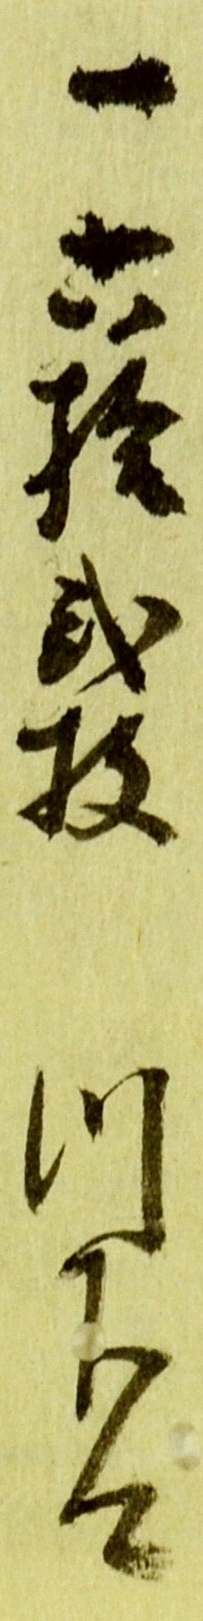一六拾弐枚川下郷

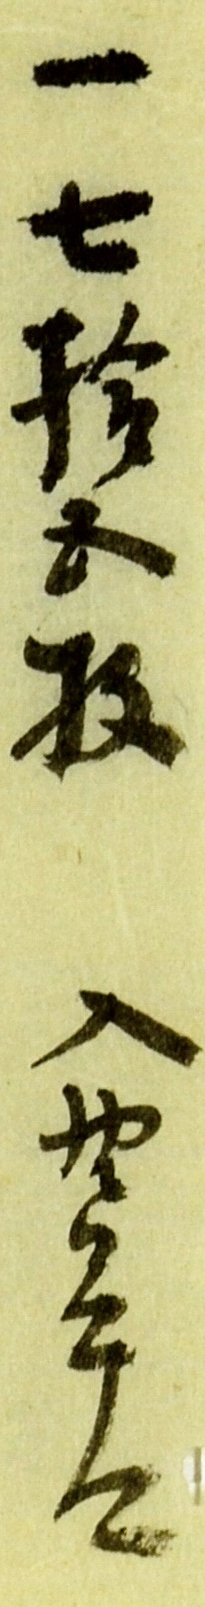一七拾五枚入野谷郷
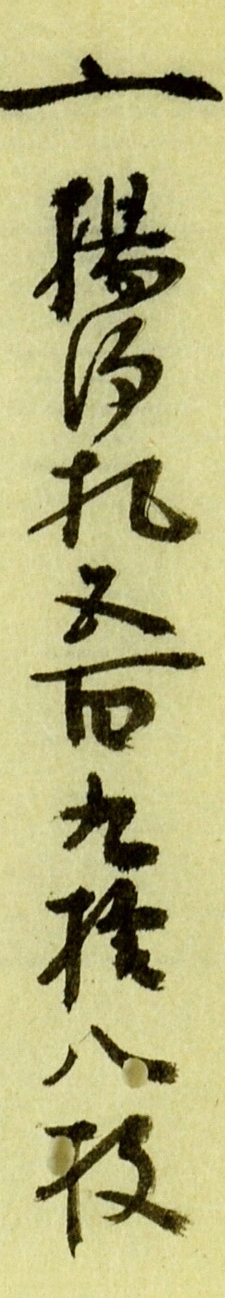〆揚酒札五百九拾八枚
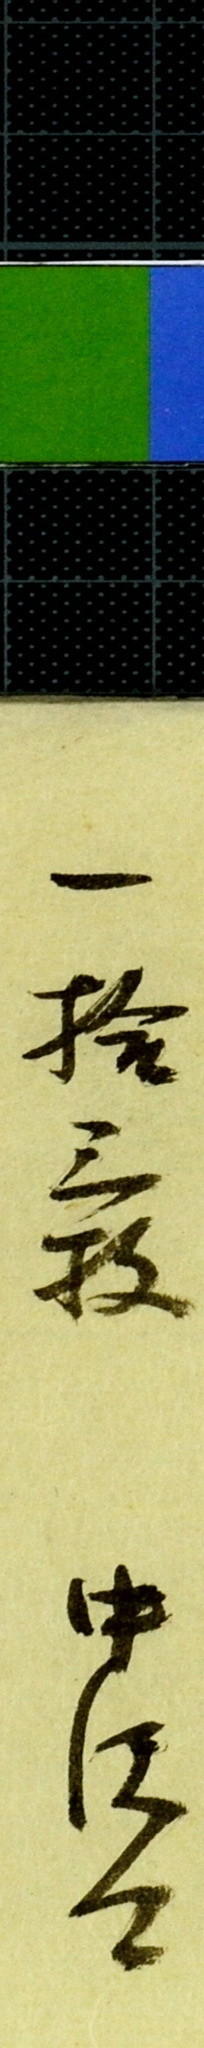一拾三枚中沢郷
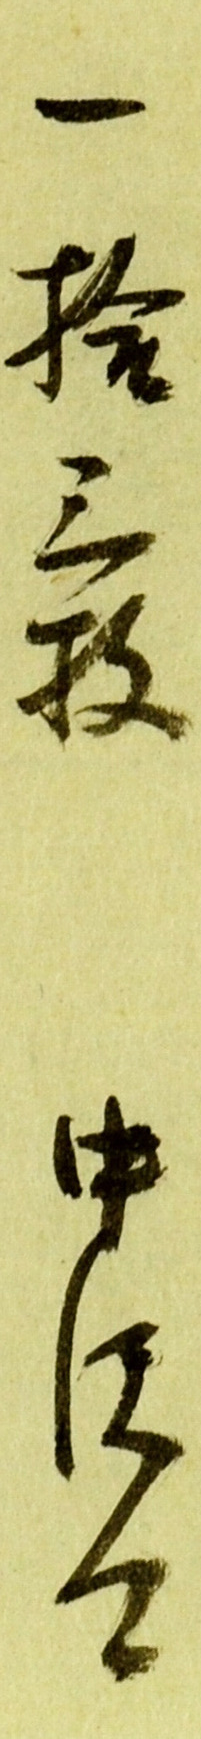一拾三枚中沢郷
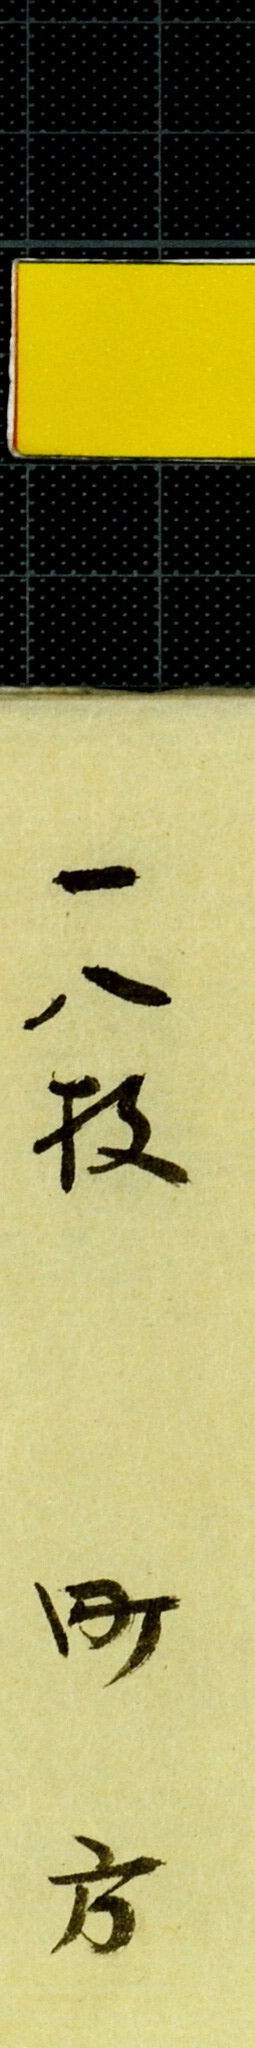一八枚町方
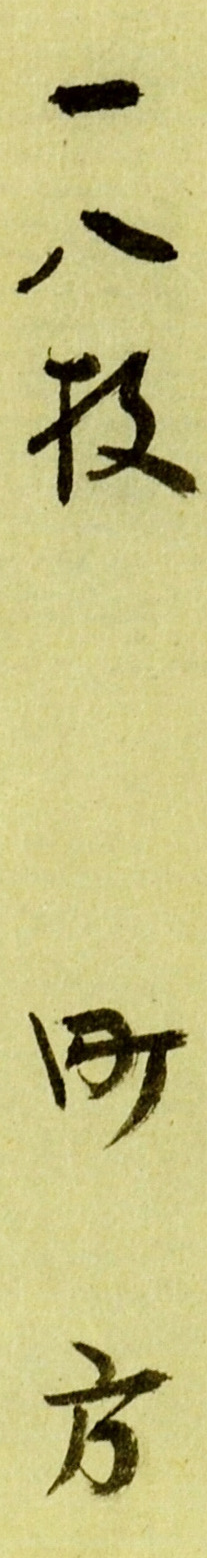一八枚町方
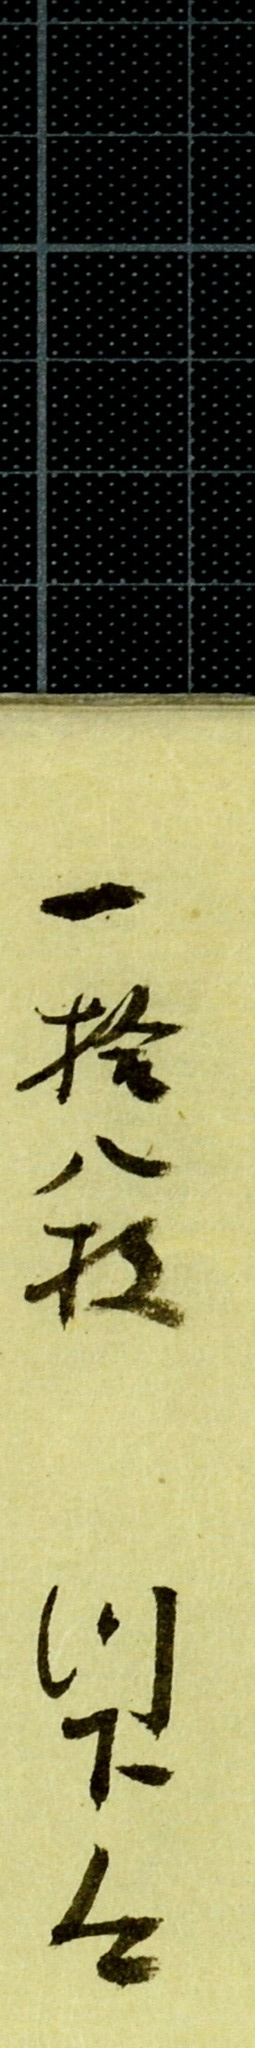一拾八枚川下郷
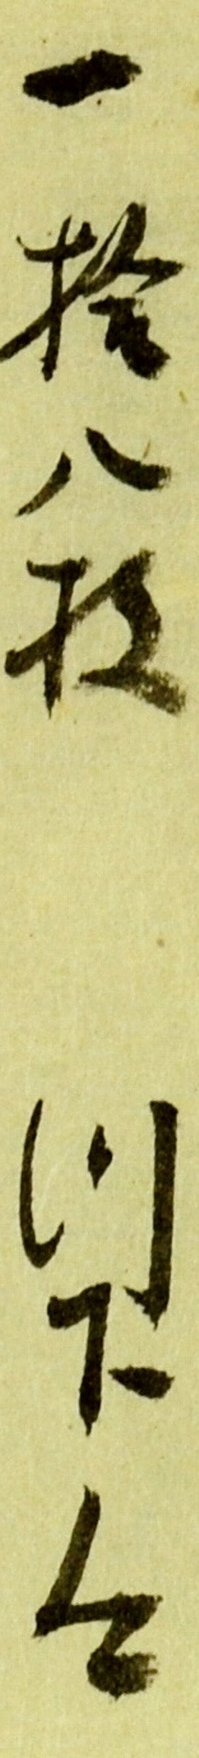一拾八枚川下郷
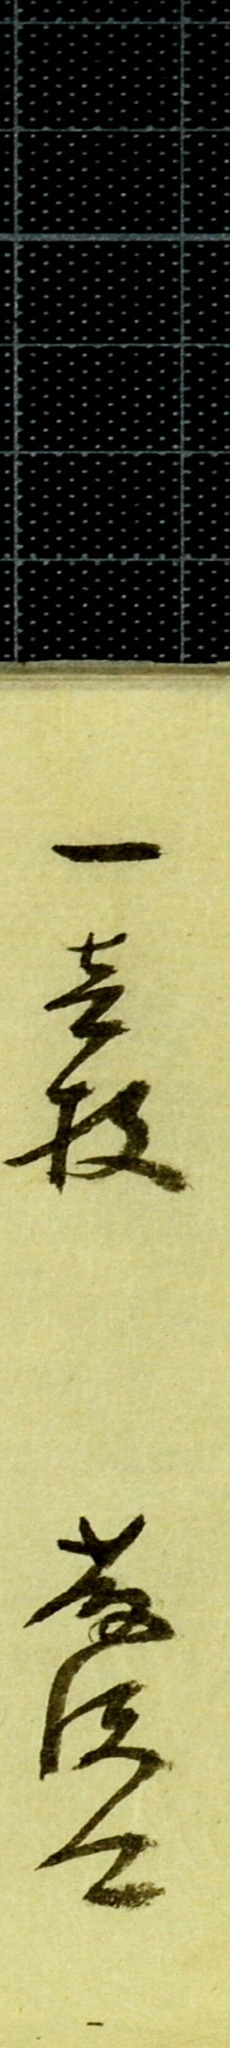一壱枚藤沢郷
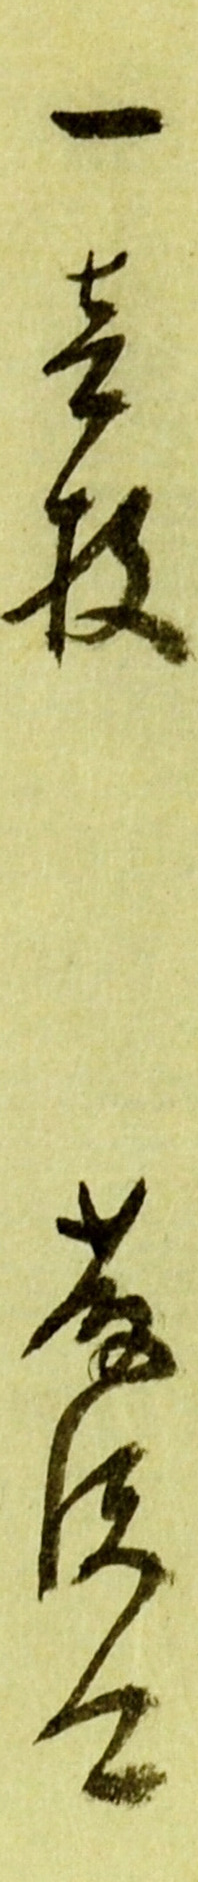一壱枚藤沢郷

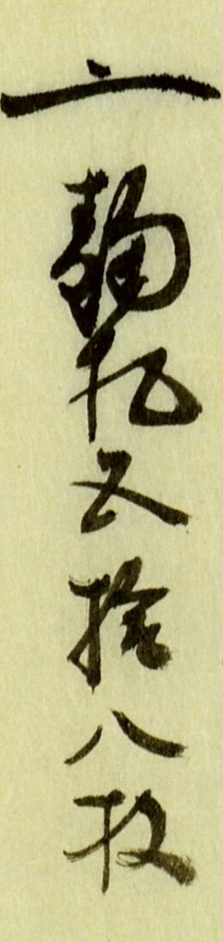〆麹札五拾八枚
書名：午年諸郷并町方鑑札渡覚
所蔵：伊那市立高遠町図書館・合同会社AMANE
